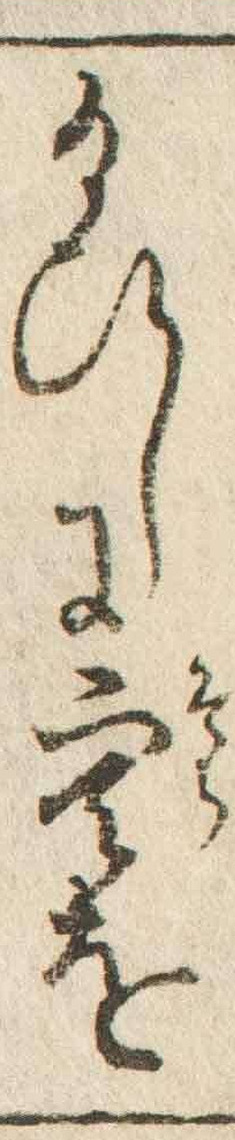給ひしに空を
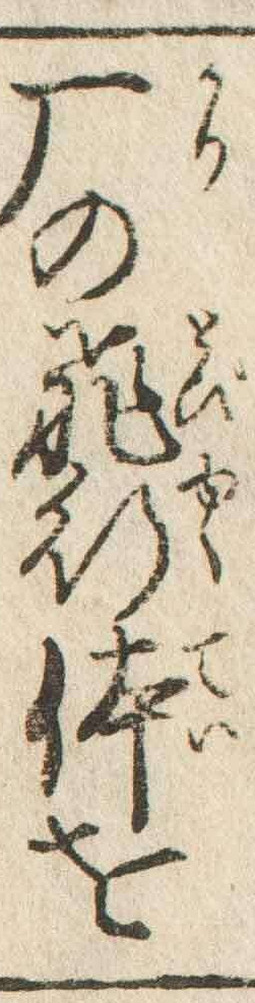雁の飛行体を
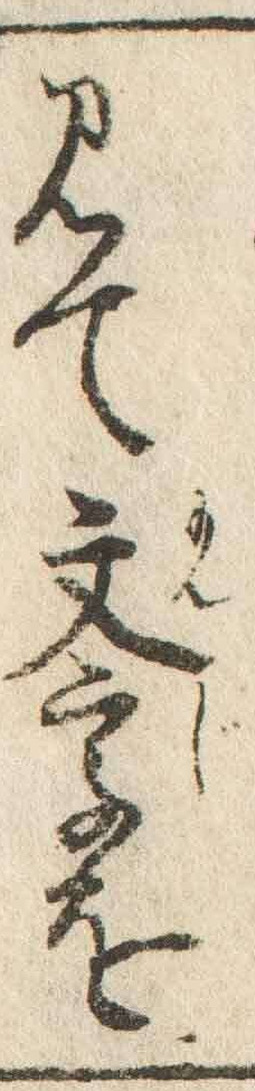身て文字を
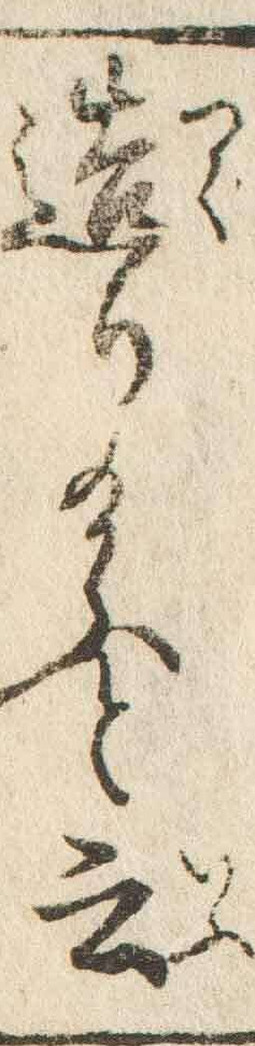造り給ふと云
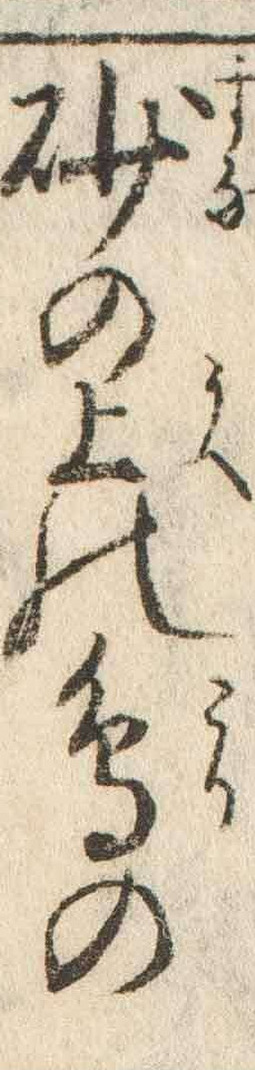砂の上の鳥の
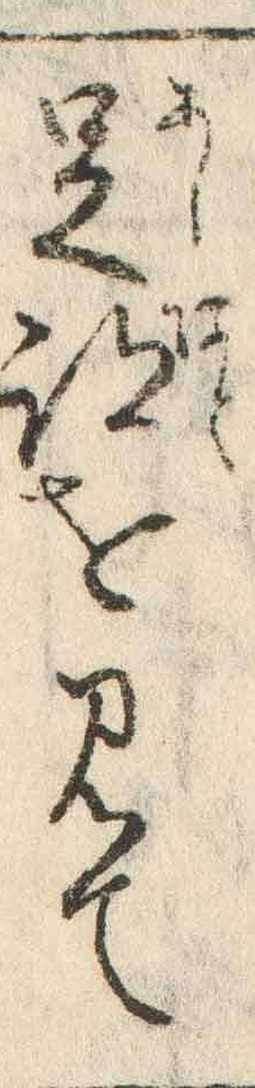足跡を見て
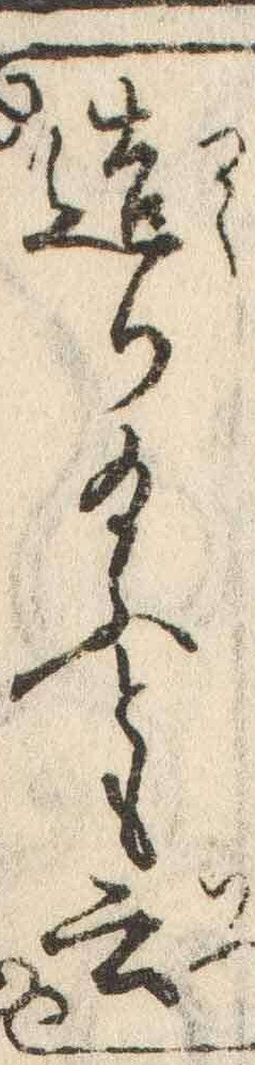造り給ふとも云
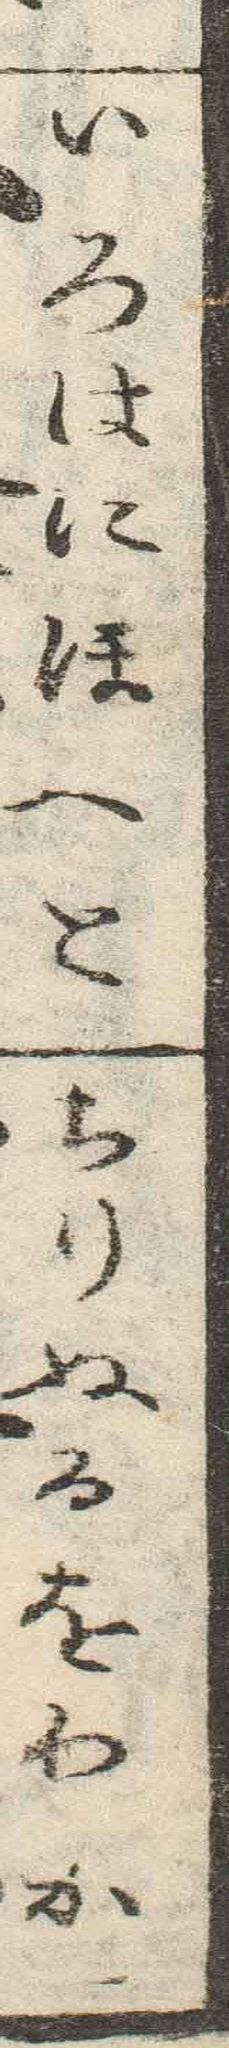〽色はにほへどちりぬるをわが世
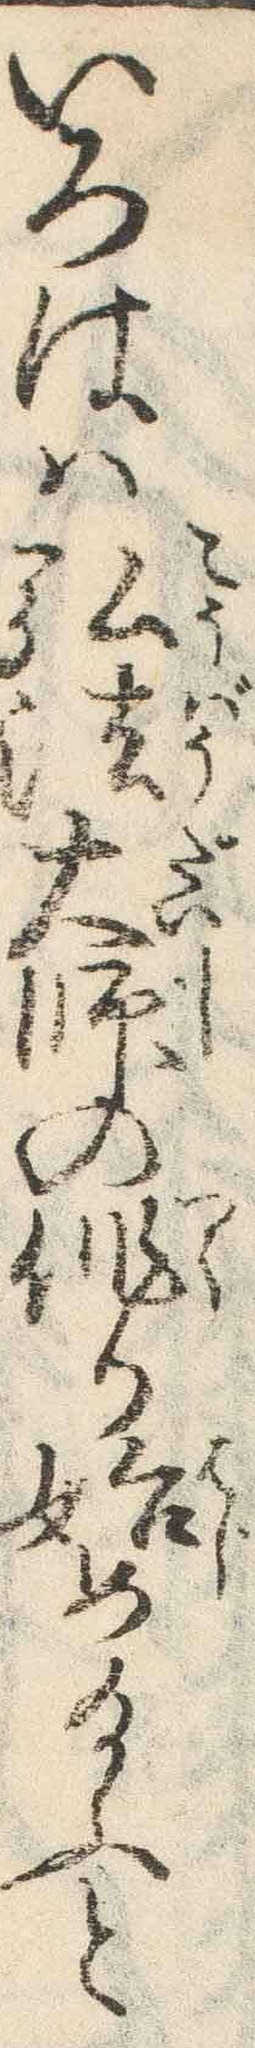いろはは弘法大師の作り始め給ふと
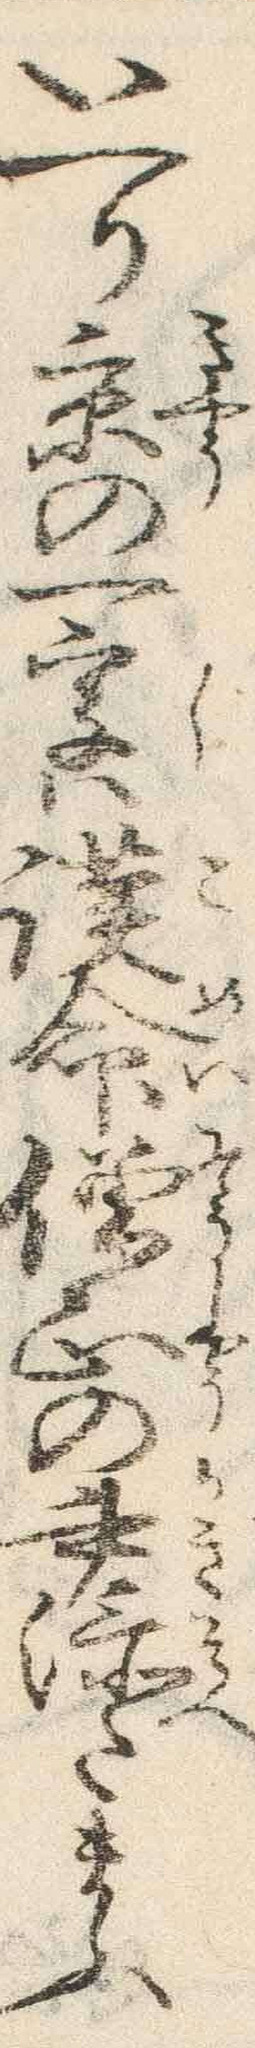いへり京の一字は護命僧正の書添たまふ
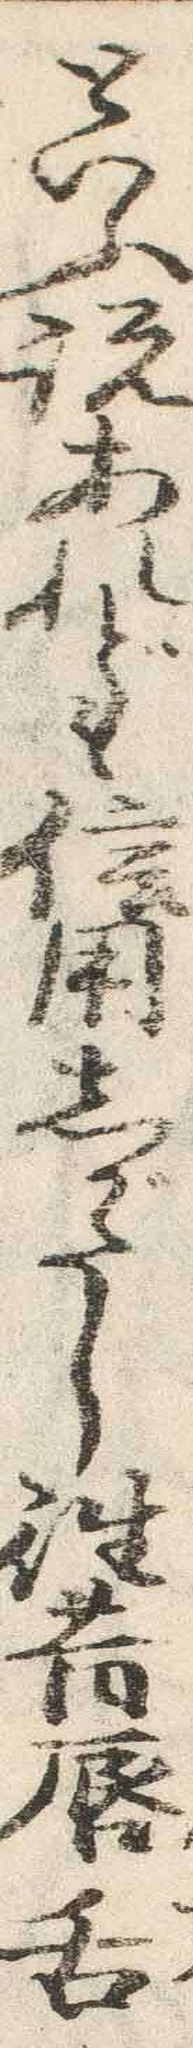といふ説あれども信用しがたし往昔唇舌
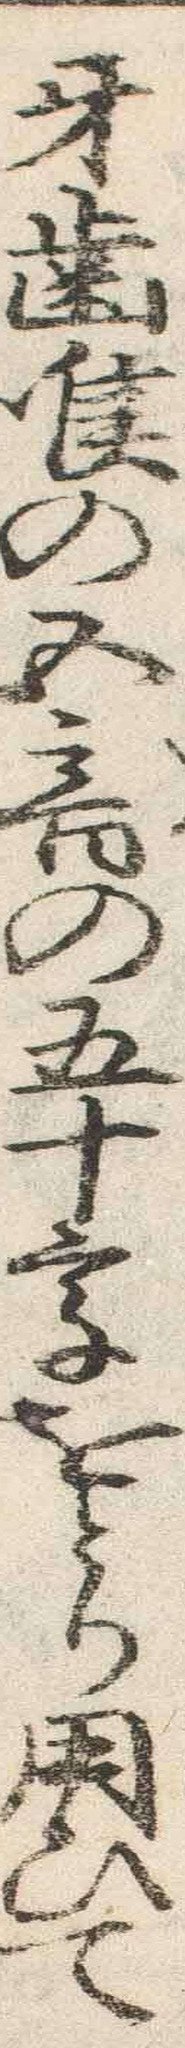牙歯喉の五音の五十字をとり用ひて
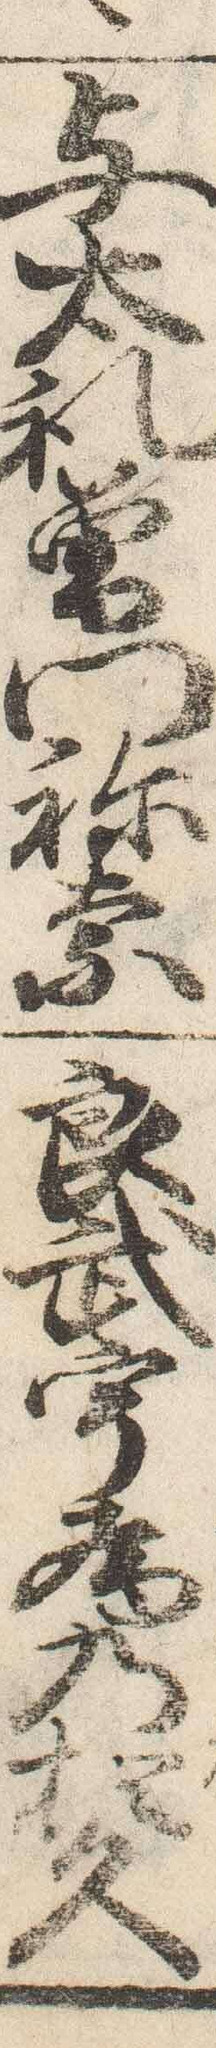与太礼曽川祢奈良武宇為乃於久
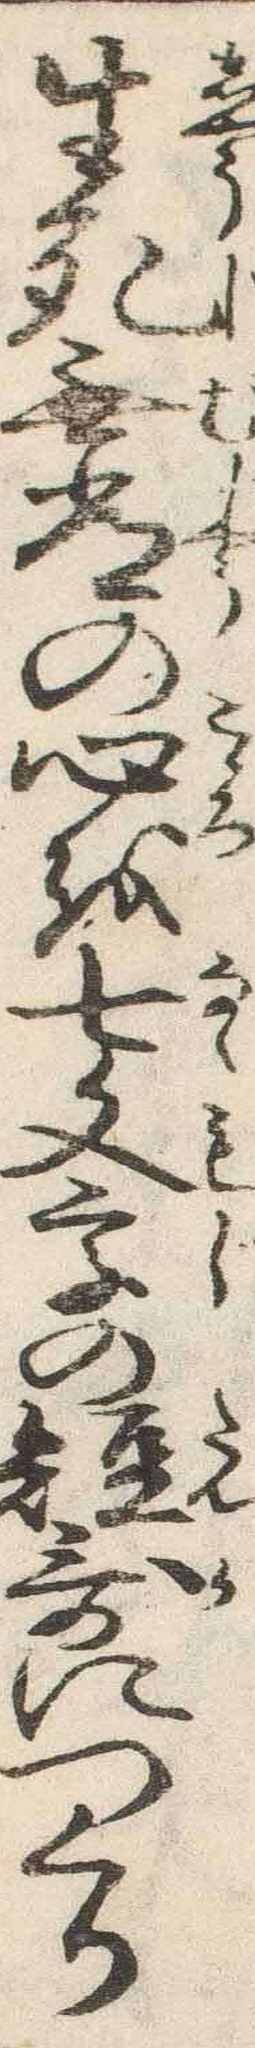生死無常の心を七文字の短歌につくり
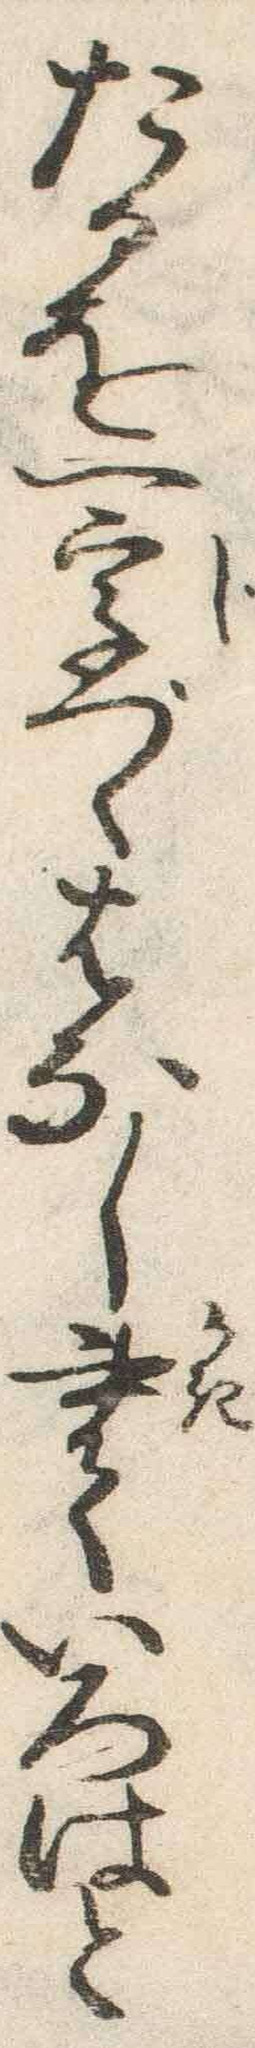たるを一字つゝはなし書ていろはと
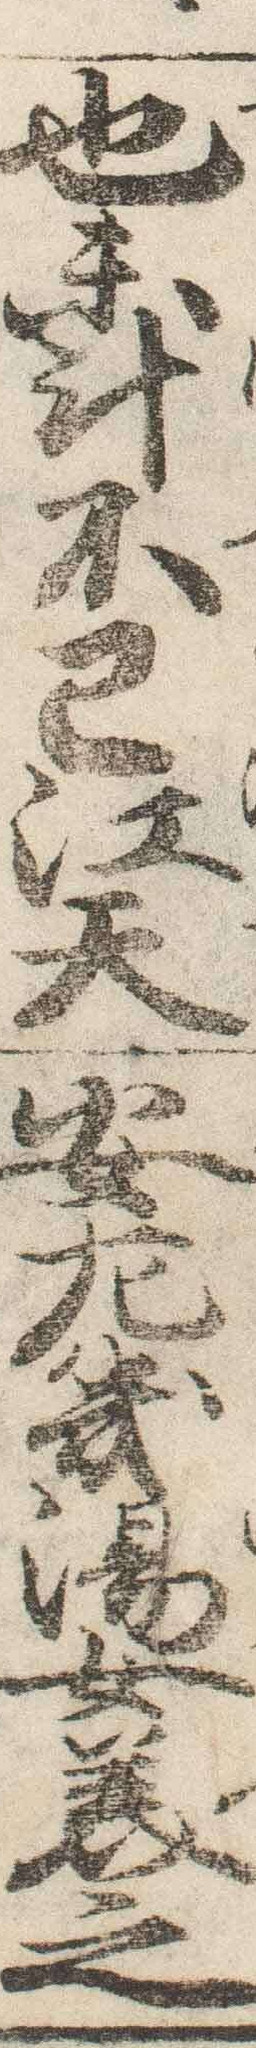也末計不己江天安左幾湯女美之
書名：撫育草
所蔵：東京学芸大学附属図書館 国文学研究資料館
